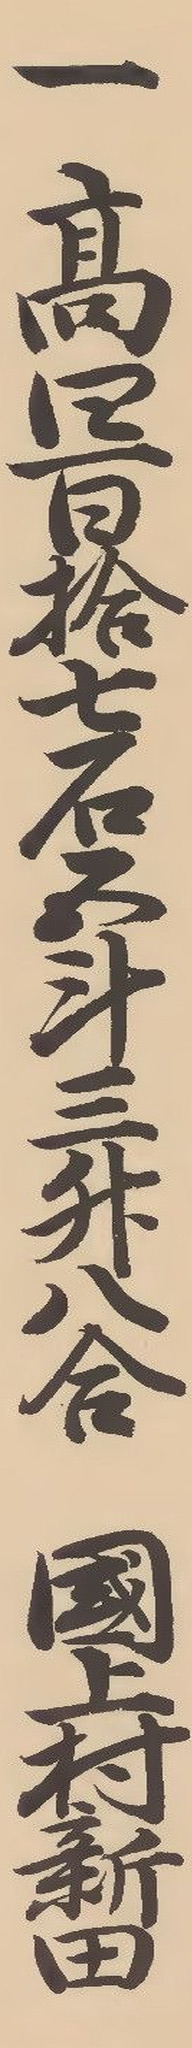一高四百拾七石五斗三升八合国上村新田
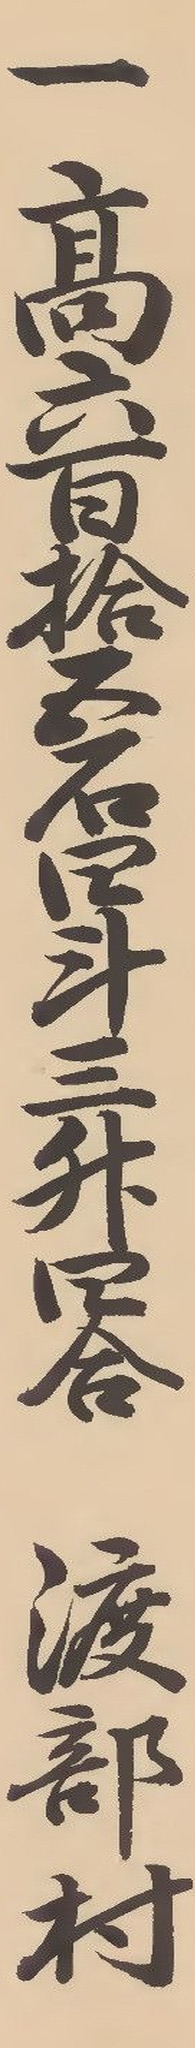一高六百拾五石四斗三升四合渡部村
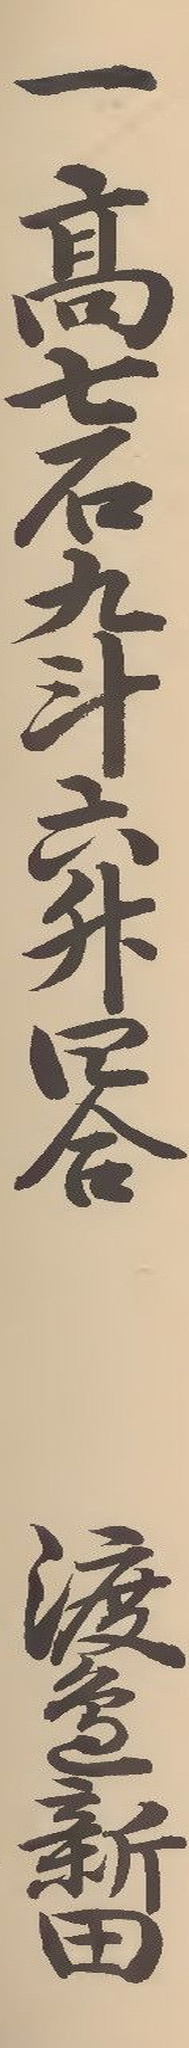一高七石九斗六升四合渡辺新田
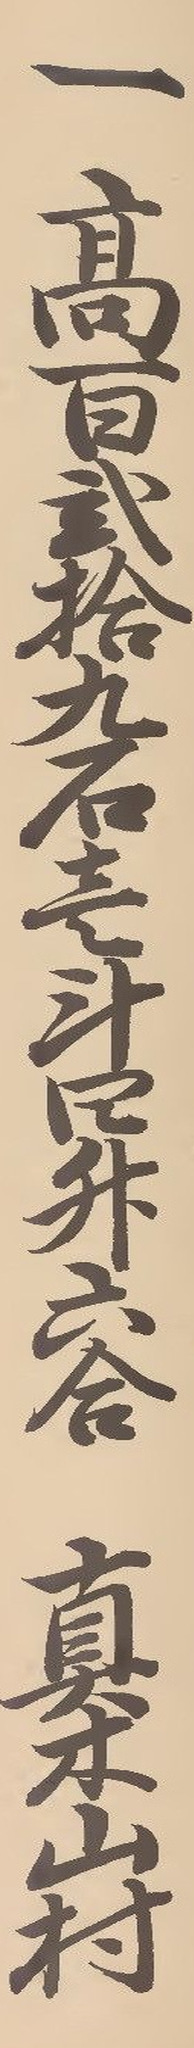一高百弐拾九石壱斗四升六合真木山村
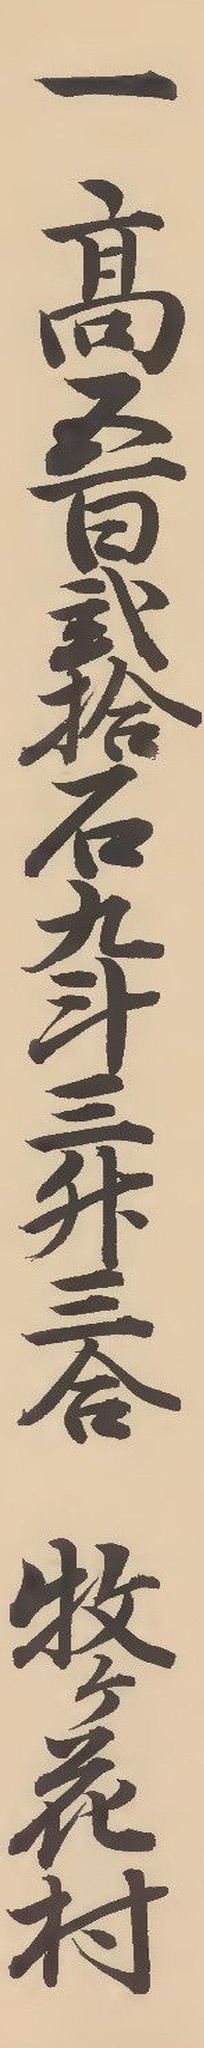一高五百弐拾石九斗三升三合牧ヶ花村
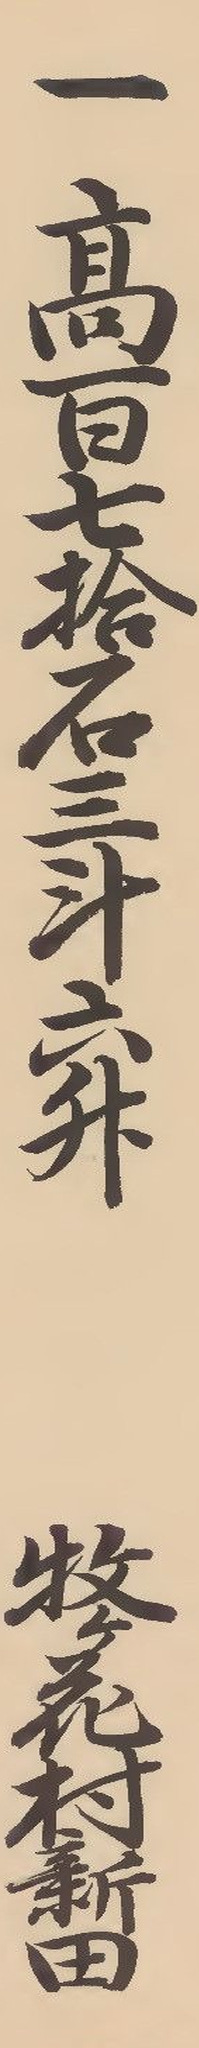一高百七拾石三斗六升牧ヶ花村新田
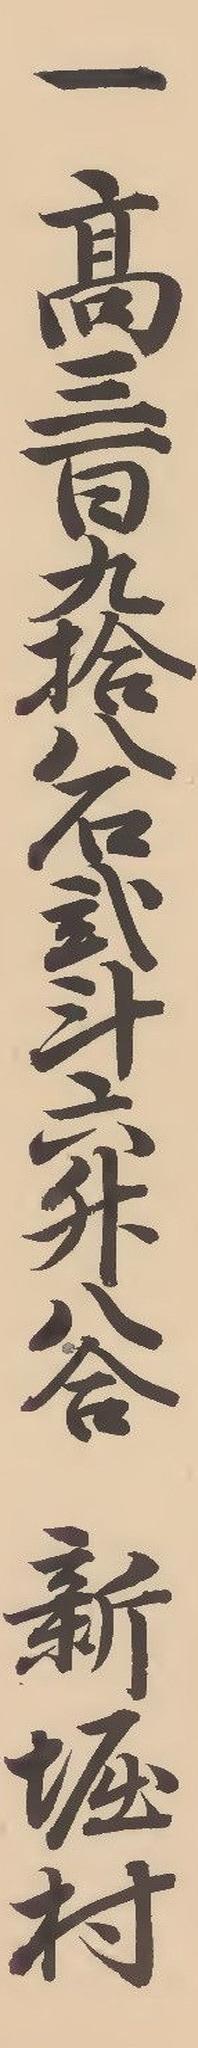一高三百九拾八石弐斗六升八合新堀村

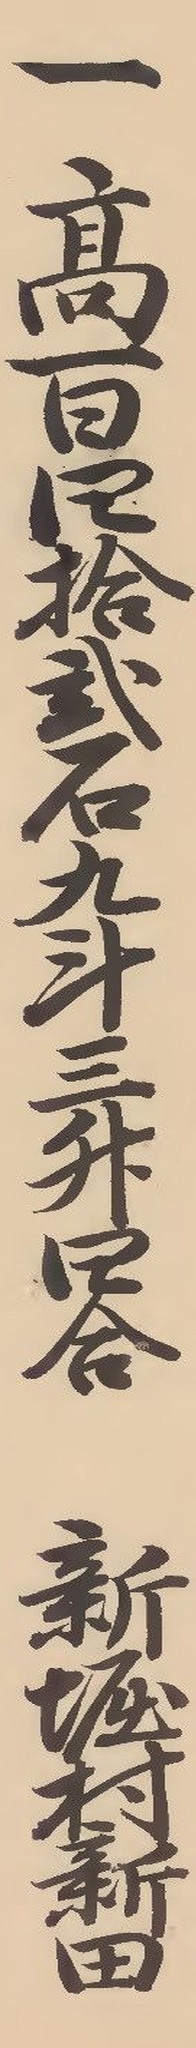一高百四拾弐石九斗三升四合新堀村新田
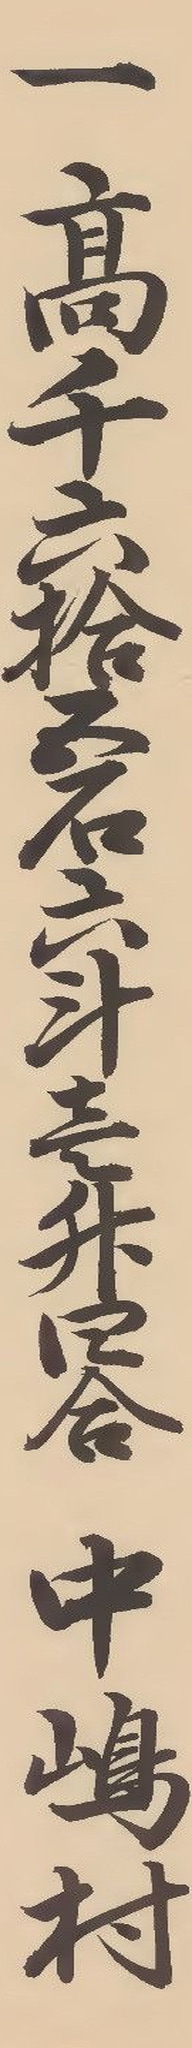一高千六拾五石六斗壱升四合中島村
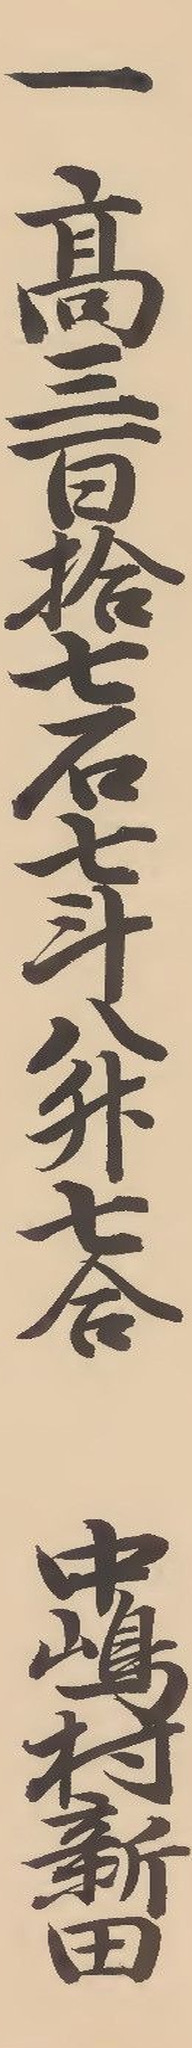一高三百拾七石七斗八升七合中島村新田
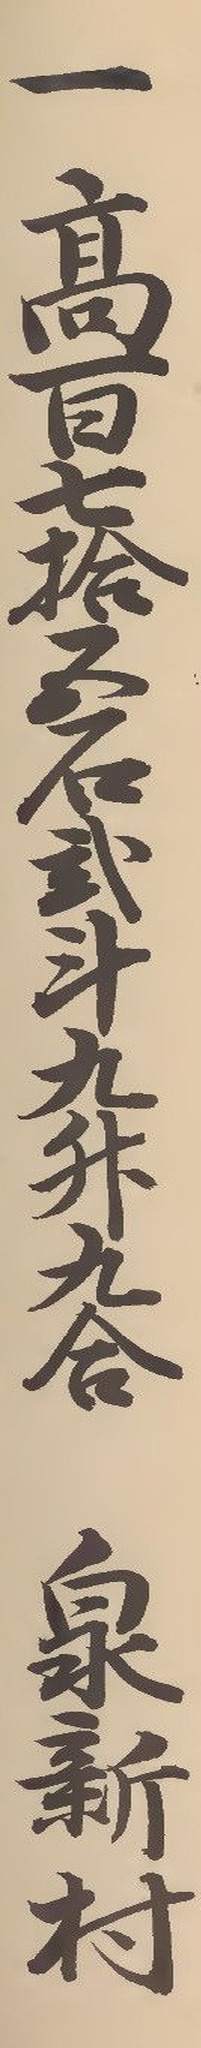一高百七拾五石弐斗九升九合泉新村
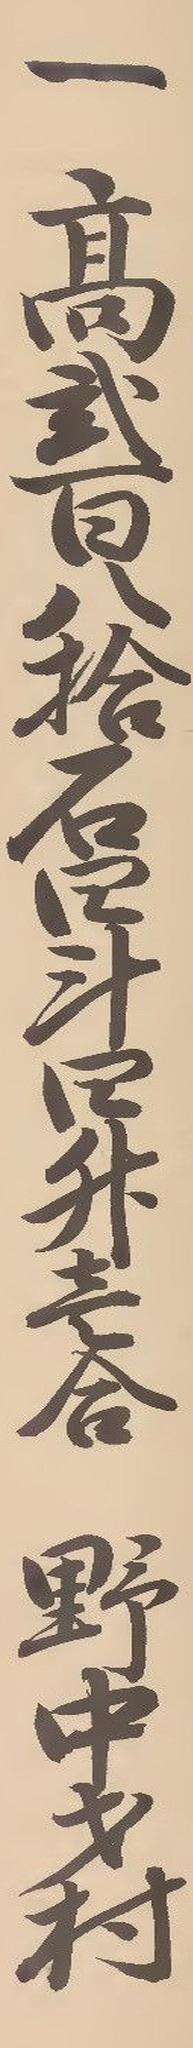一高弐百八拾石四斗四升壱合野中才村
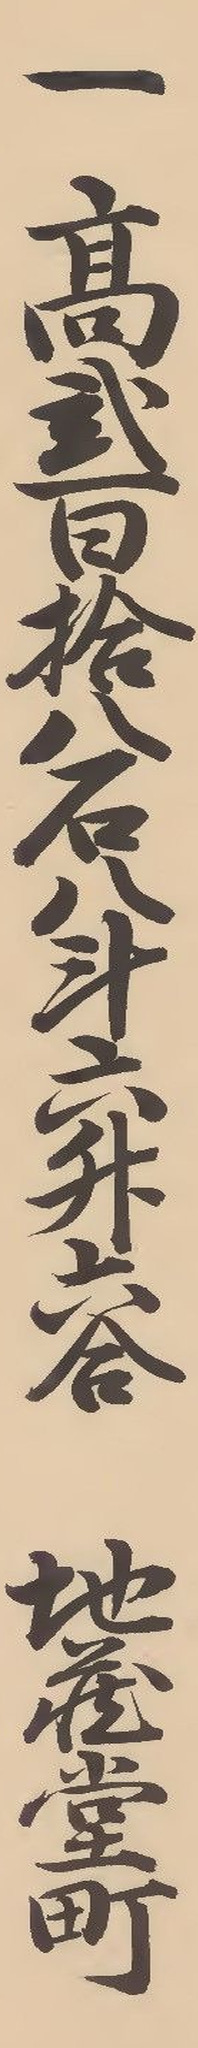一高弐百拾八石八斗六升六合地蔵堂町
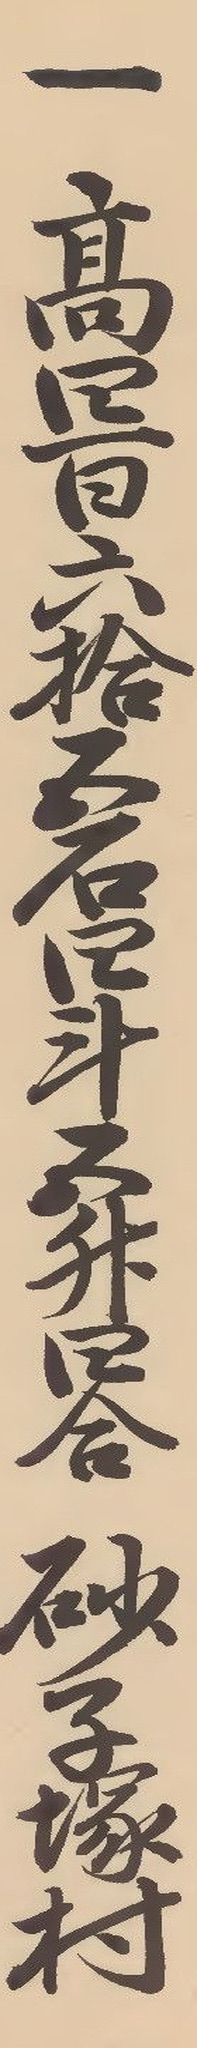一高四百六拾五石四斗五升四合砂子塚村
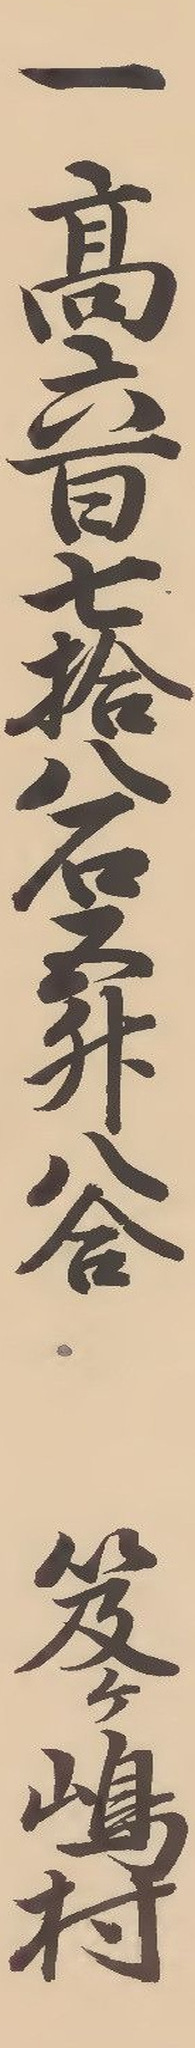一高六百七拾八石五升八合笈ヶ島村

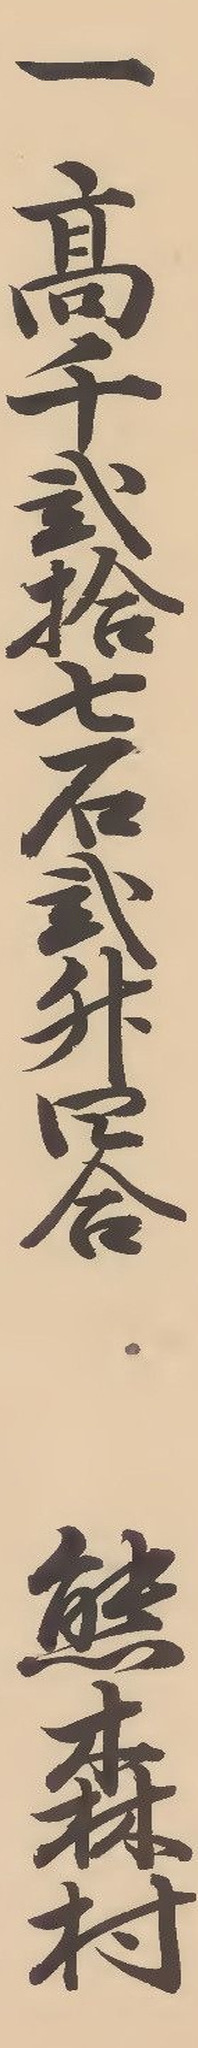一高千弐拾七石弐升四合熊森村
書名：越後国郷帳　下
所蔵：国立公文書館 National Archives of Japan
